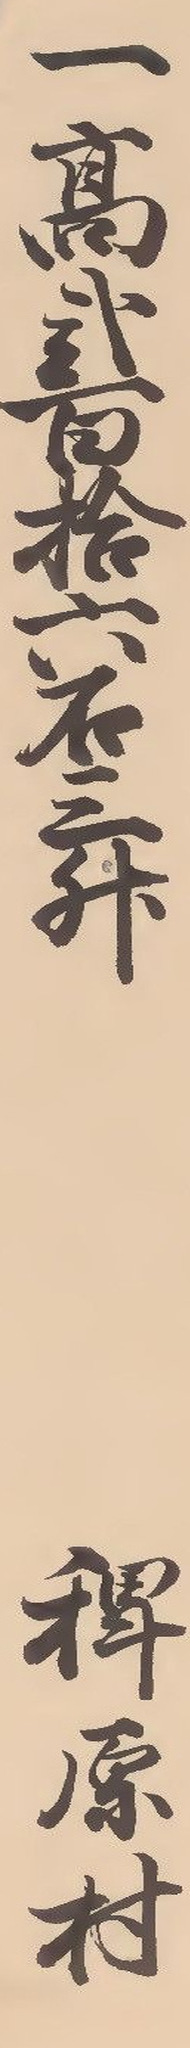一高弐百拾六石三升稗原村
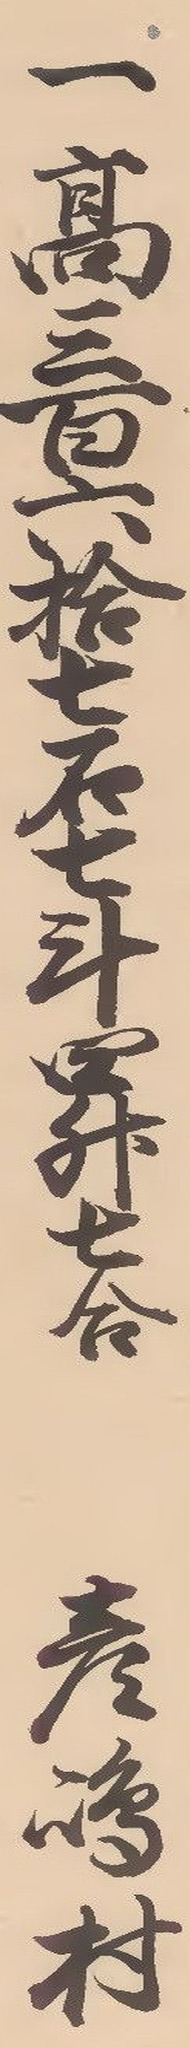一高三百六拾七石七斗四升七合彦島村
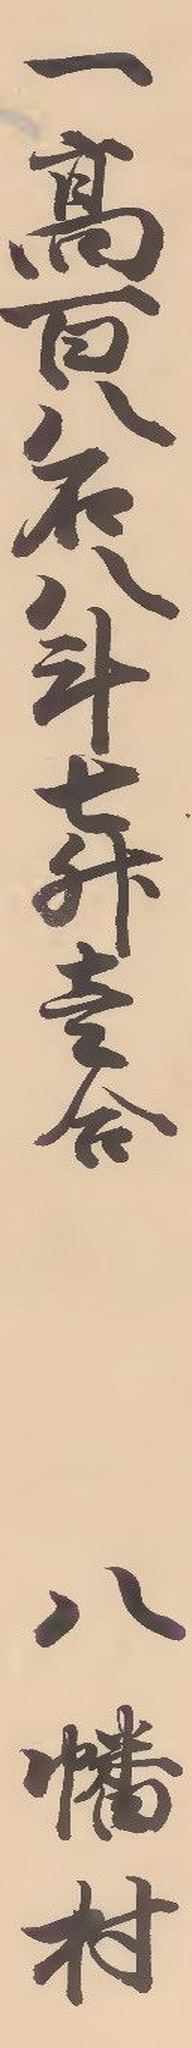一高百八石八斗七升壱合八幡村

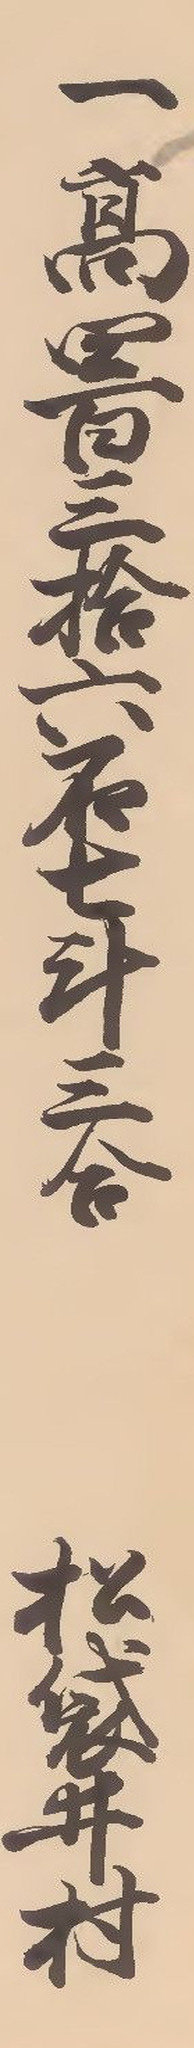一高四百三拾六石七斗三合松袋井村
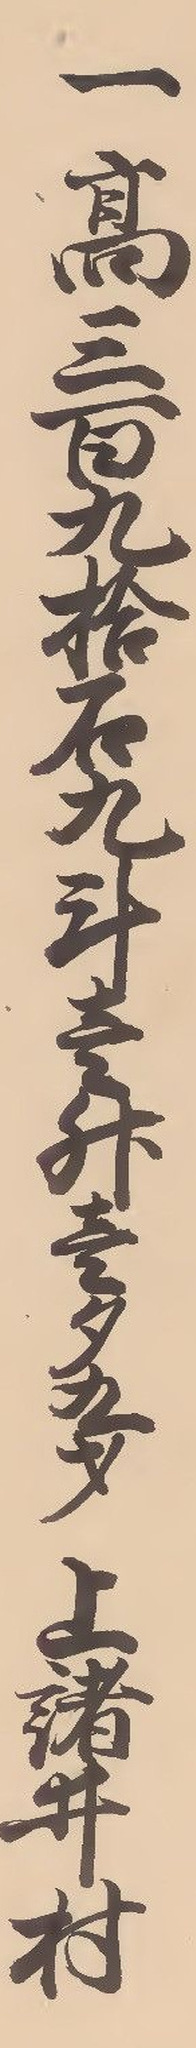一高三百九拾石九斗壱升壱勺九才上諸井村
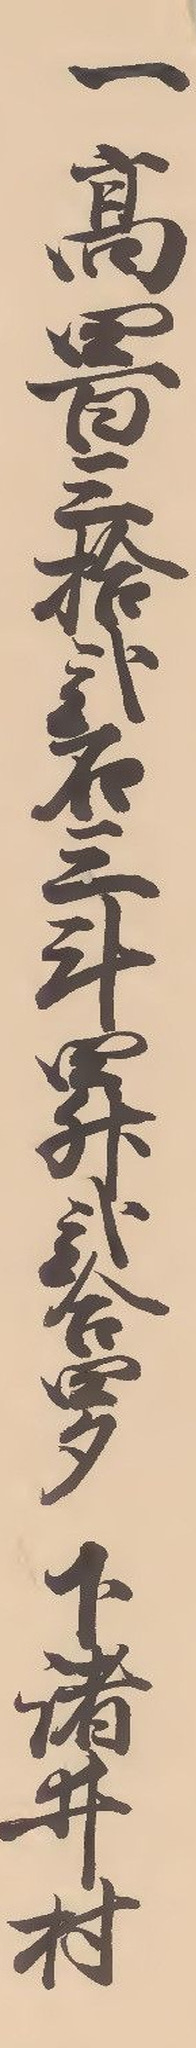一高四百三拾弐石三斗四升弐合四勺下諸井村
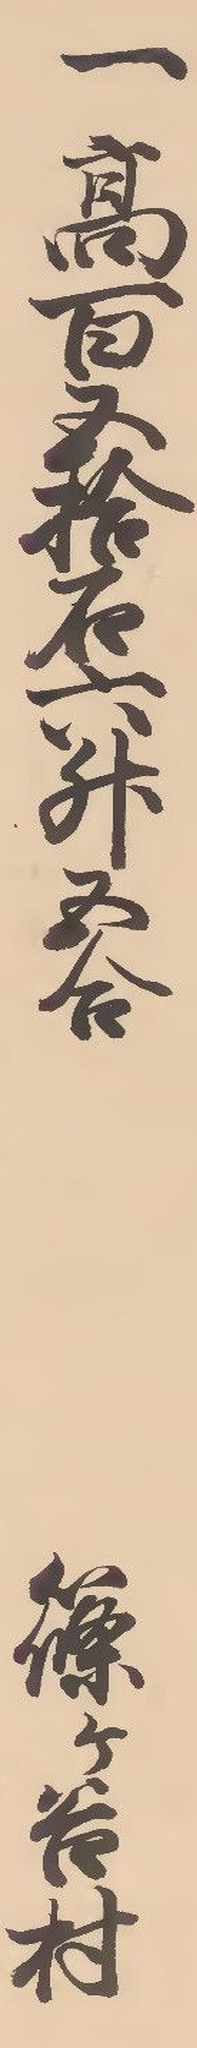一高百五拾石六升五合篠ヶ谷村
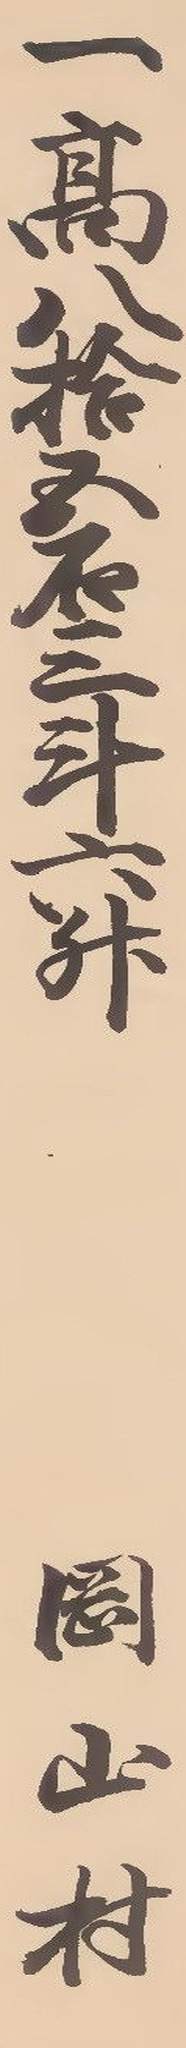一高八拾五石三斗六升岡山村
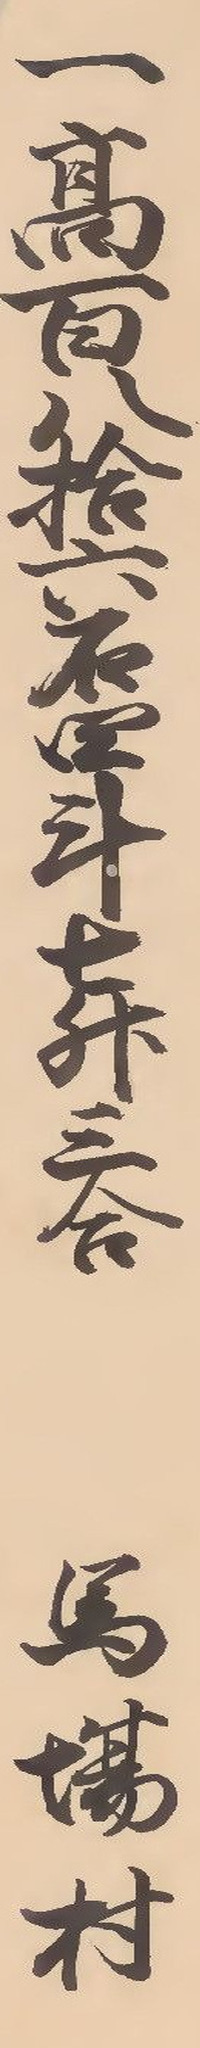一高百八拾六石四斗七升三合馬場村
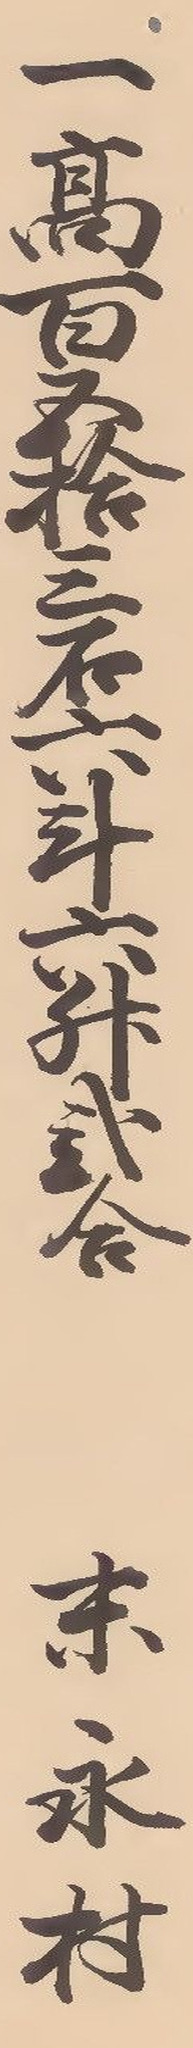一高百五拾三石六斗六升弐合末永村

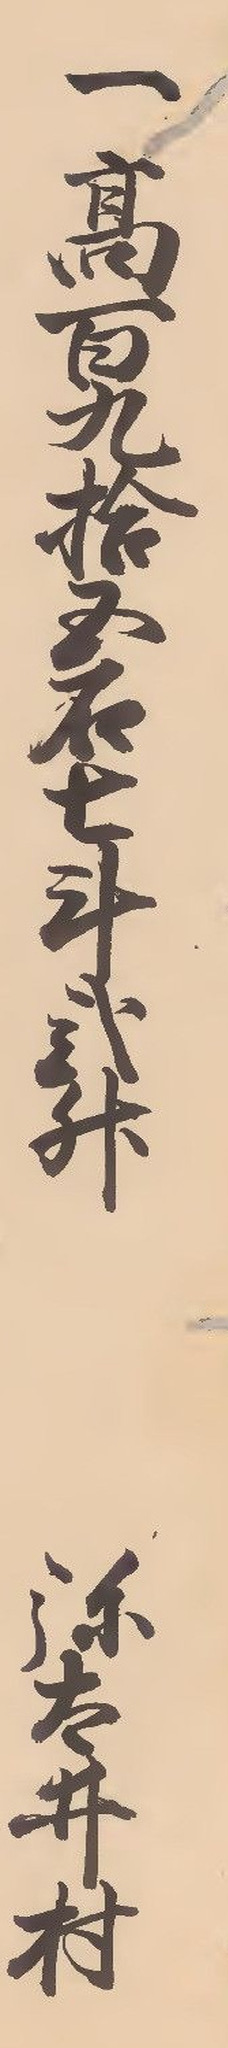一高百九拾五石七斗弐升弥太井村
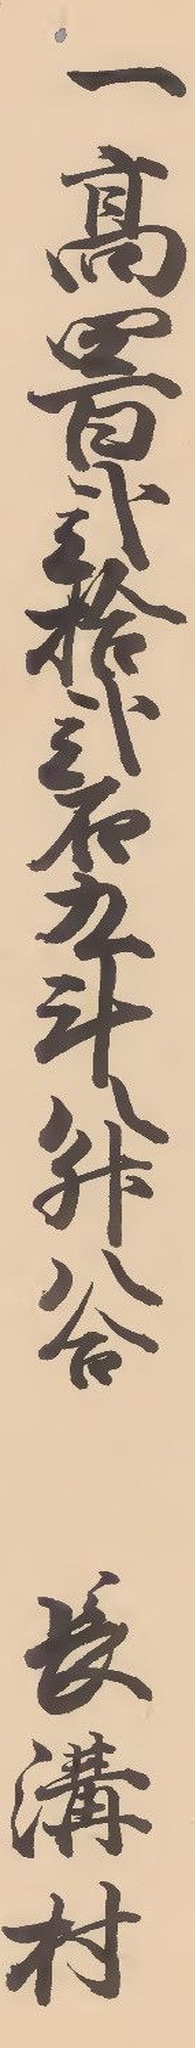一高四百弐拾弐石九斗八升八合長溝村
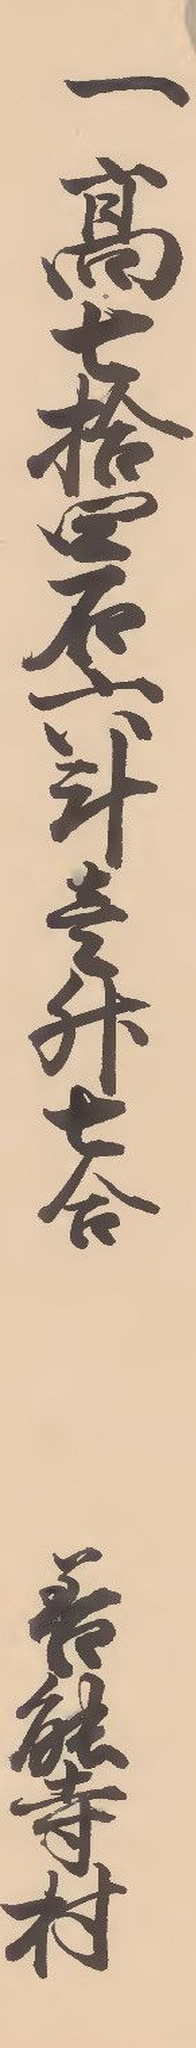一高七拾四石六斗壱升七合善能寺村
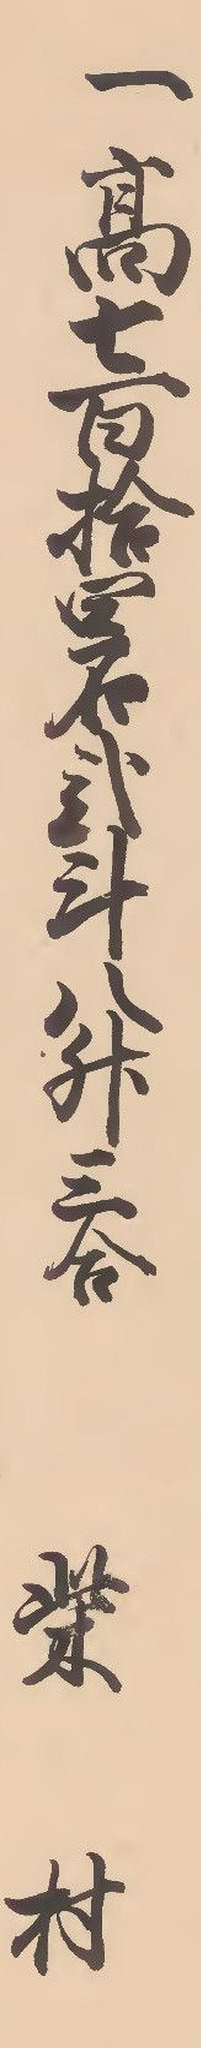一高七百拾四石弐斗八升三合柴村
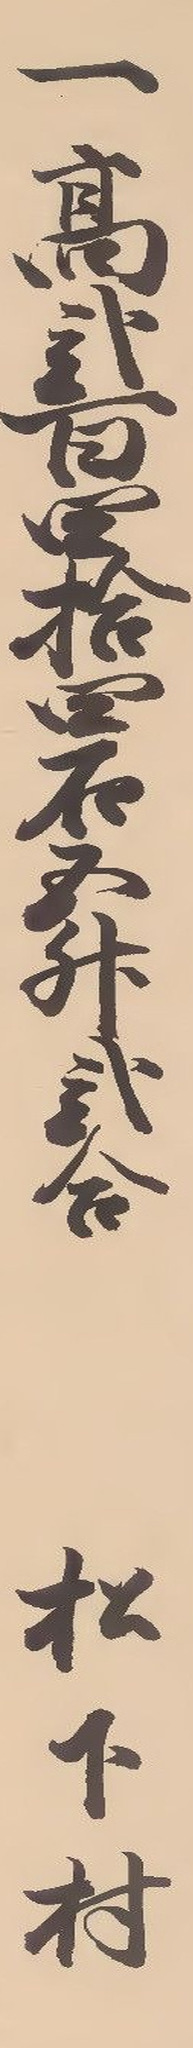一高弐百四拾四石五升弐合松下村
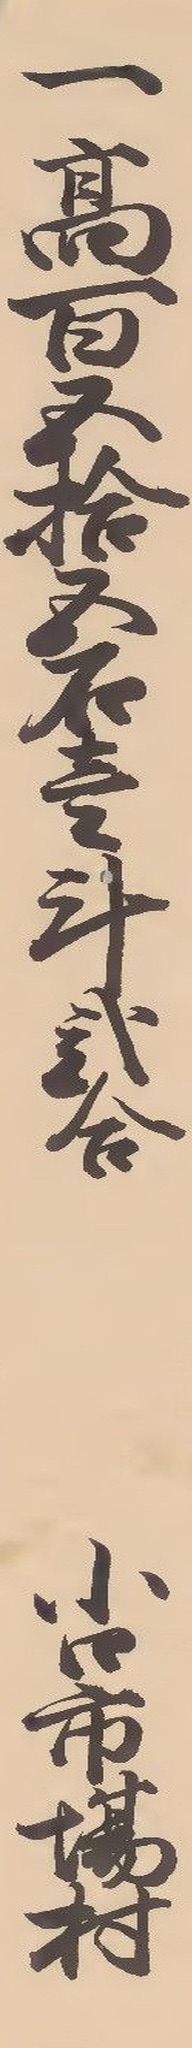一高百五拾五石壱斗弐合小口市場村
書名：遠江国郷帳
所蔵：国立公文書館 National Archives of Japan
